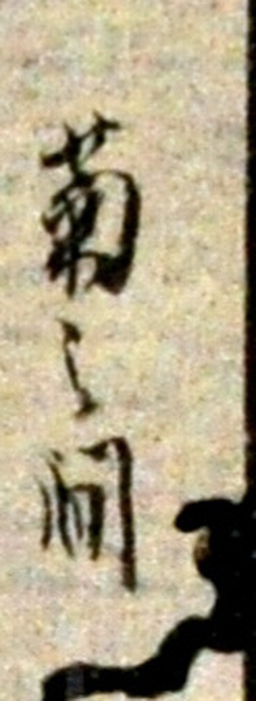菊之間
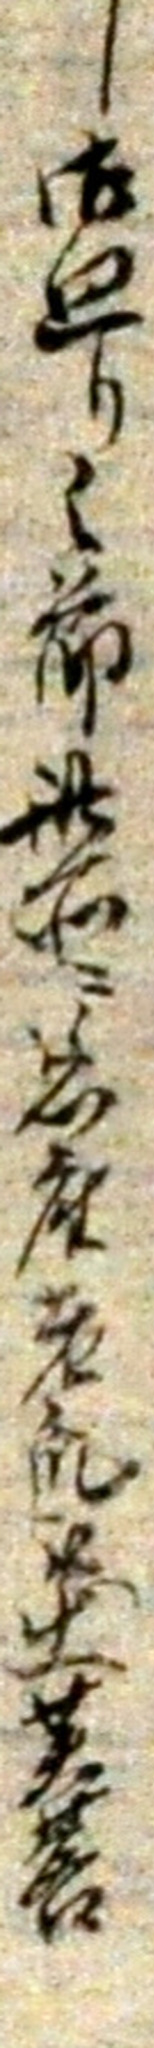御廻り之節此所ニ着座老衆被出芙蓉
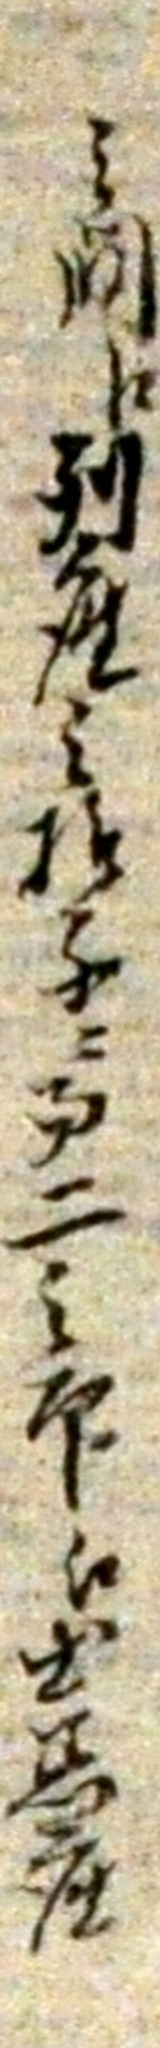之間え列座之様子ニ而二ノ印え出着座
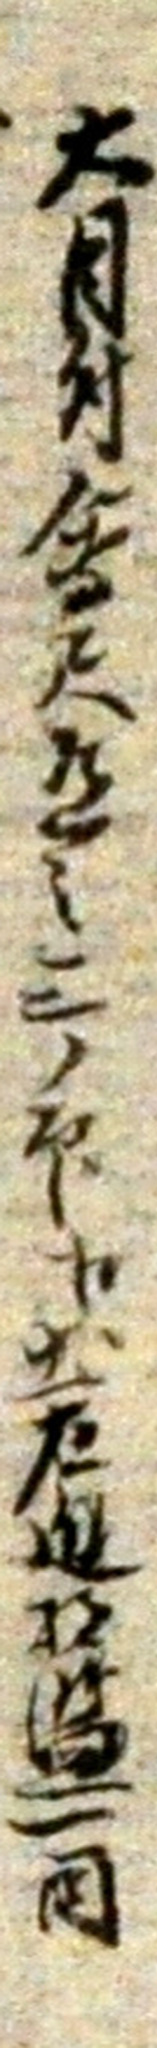大目付会尺有之三ノ印ヘ出左近将監一同
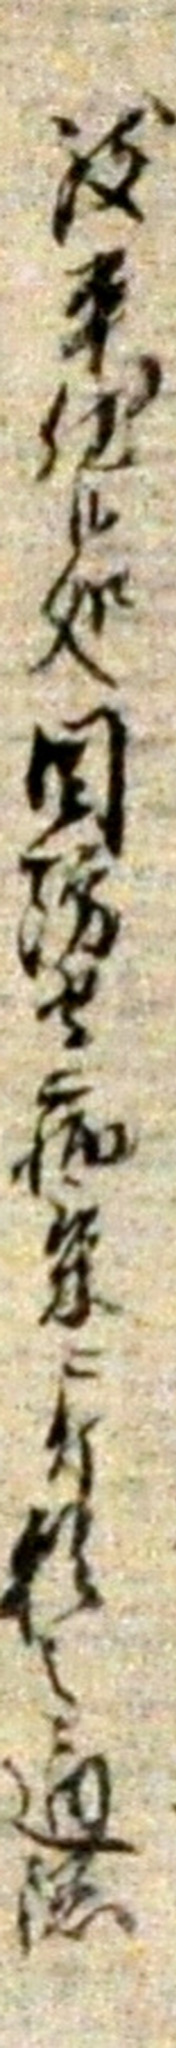致平伏候処周防守病気ニ付願之通隠
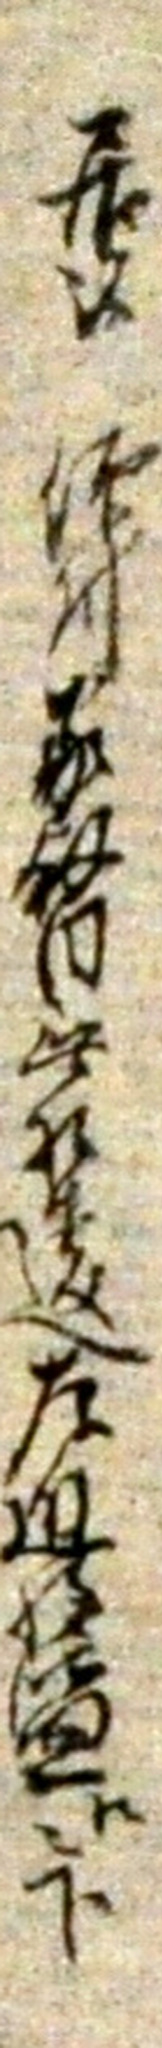居被仰付家督無相違左近将監え被下
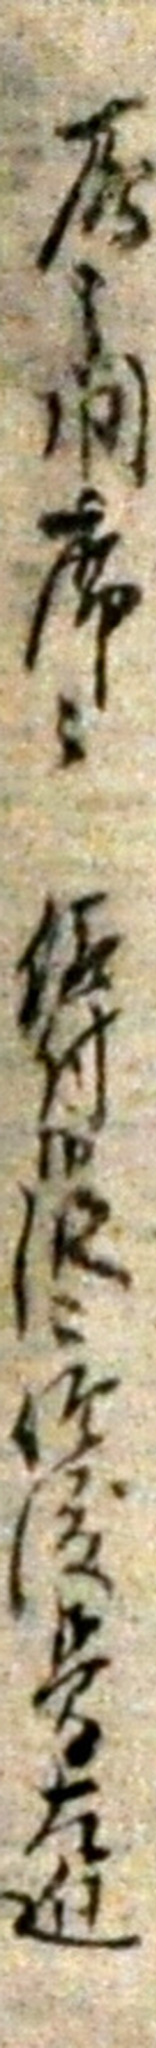雁之間席被仰付候段被仰渡候間左近
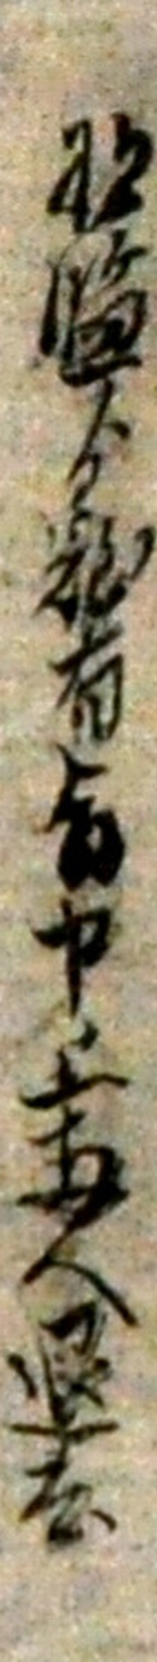将監ゟ難有旨申上両人退去

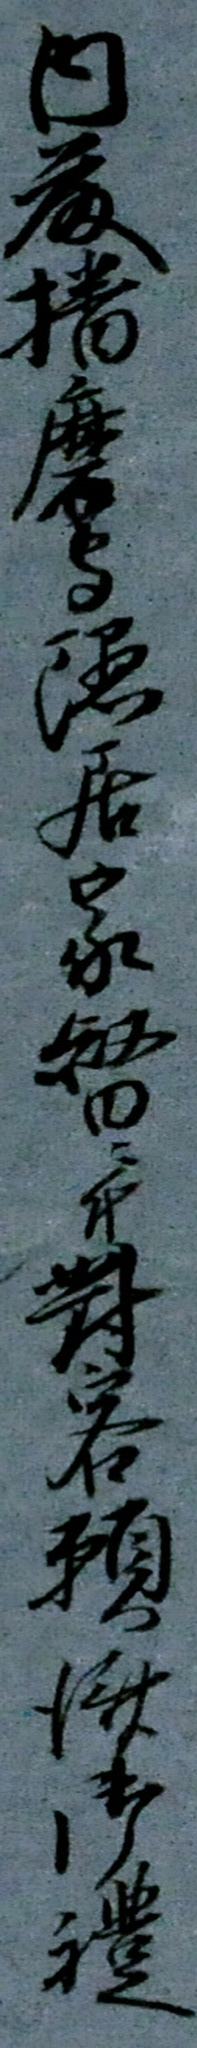内藤播磨守隠居家督ニ付対客願済御礼
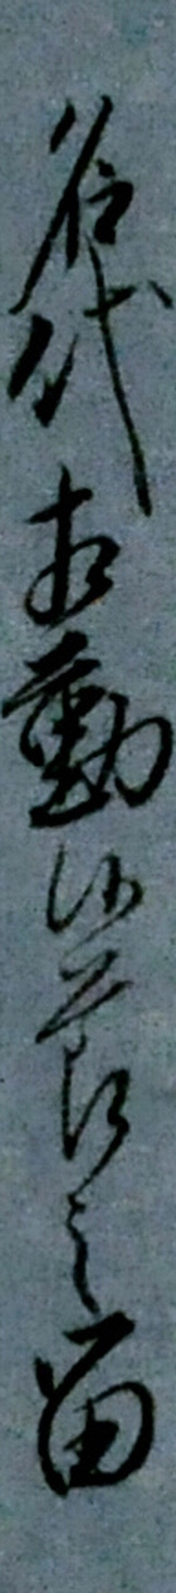名代相勤候節之留
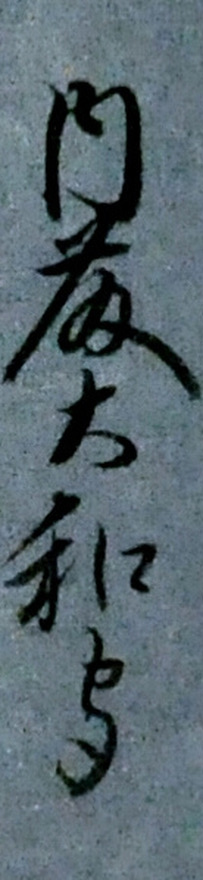内藤大和守

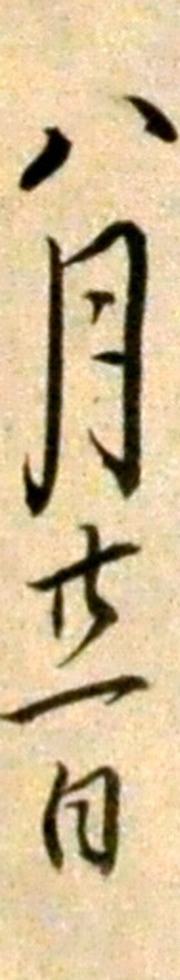八月廿一日
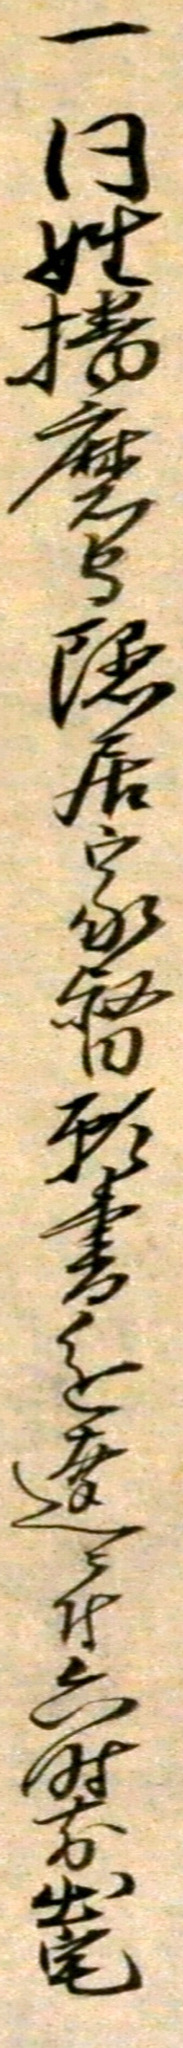一同姓播磨守隠居家督願書進達ニ付六時前出宅
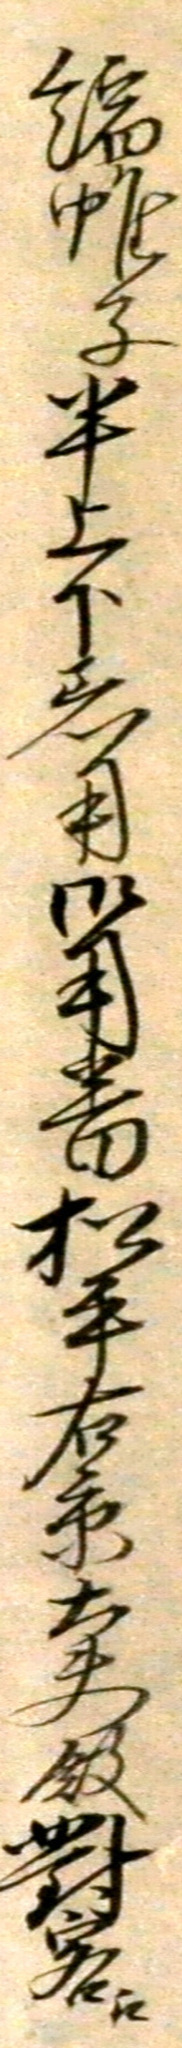縮帷子半上下着用御用番松平右京大夫殿対客え
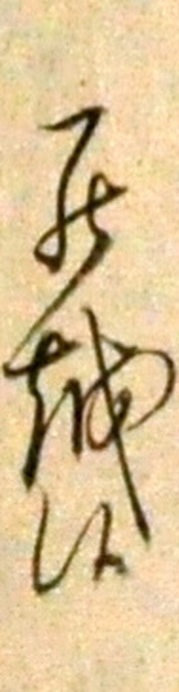罷越候
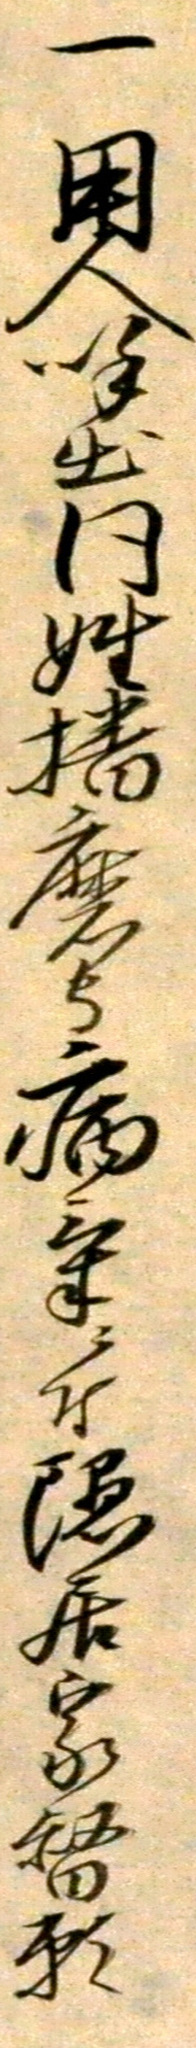一用人呼出同姓播磨守病気ニ付隠居家督願
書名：諸名代相勤候節ノ留書外
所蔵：伊那市立高遠町図書館・合同会社AMANE
